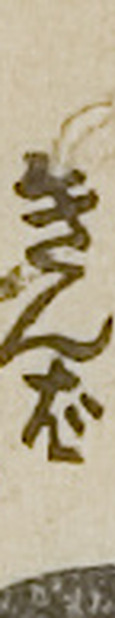きんば
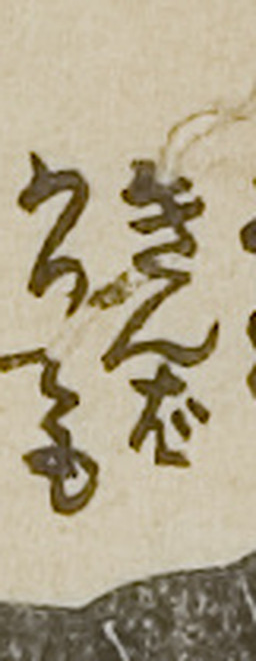かりても
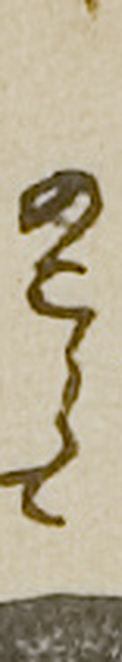のこして
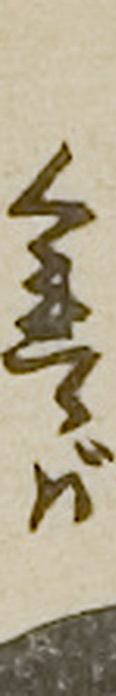くれゝば
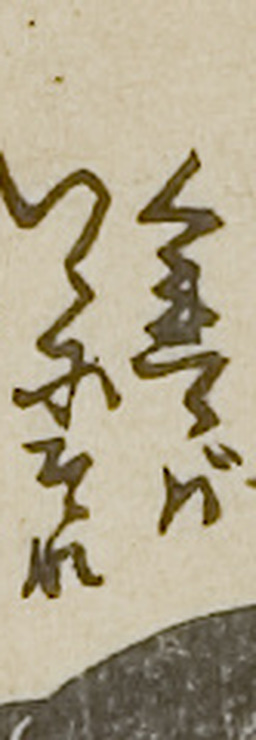いゝにそれ
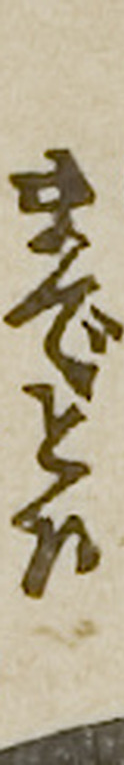までとは
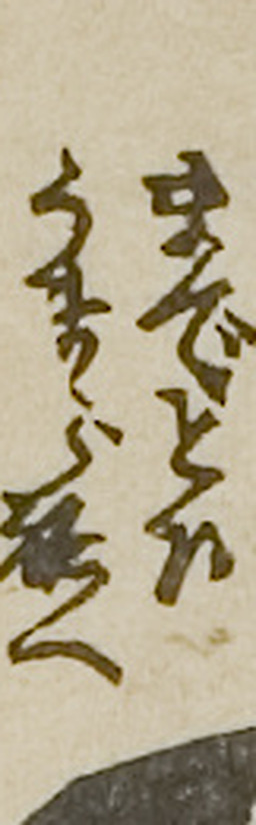うまらねへ
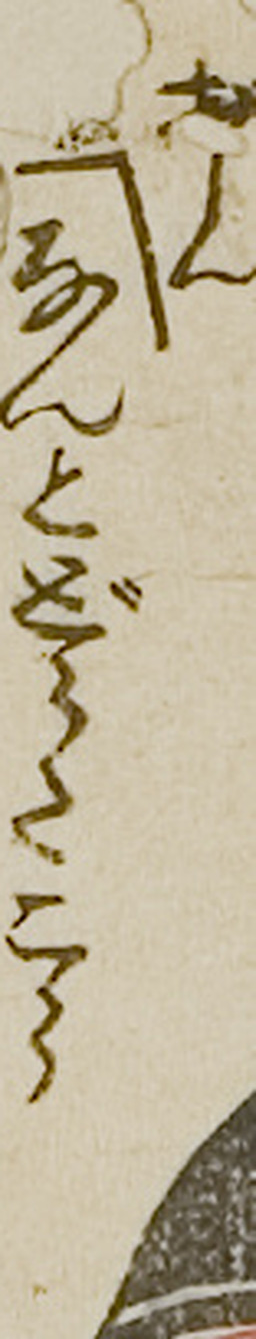〽なんとどうたこう
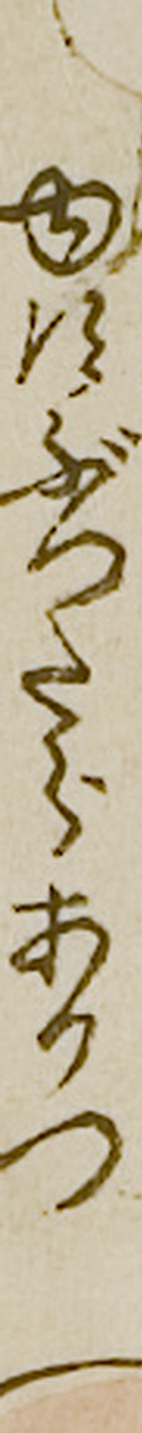ゆすぶつたらありつ
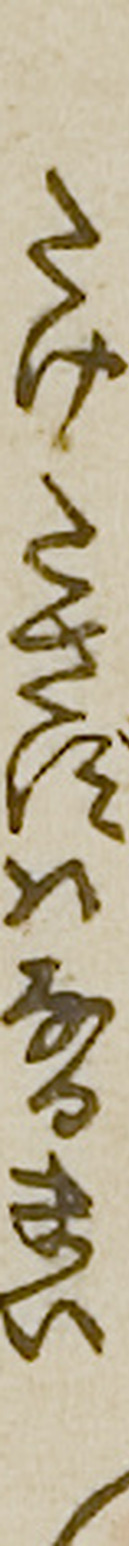たけたさずはなるまい
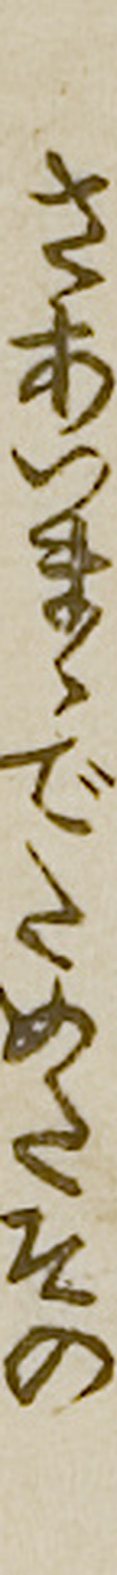さあいまゝでためたその
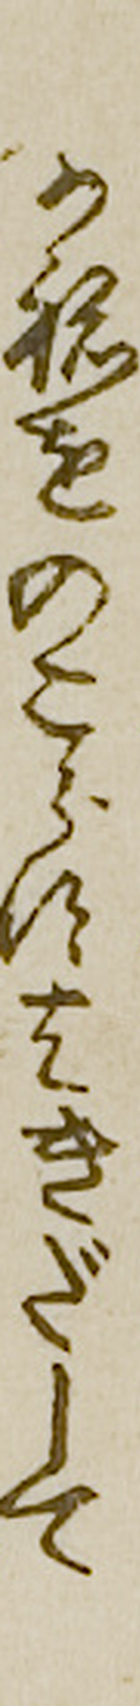かねをのこらすはきだして
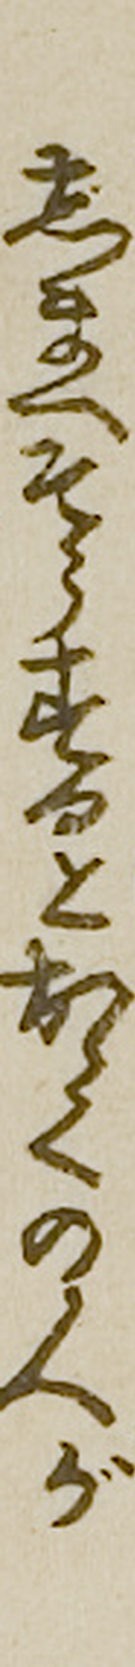しまへそうするとおゝくの人が
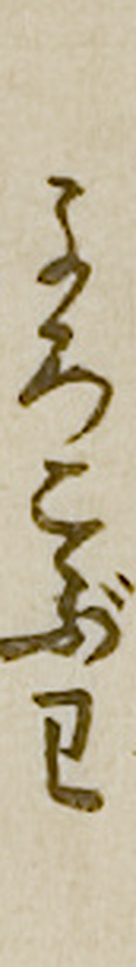よろこぶわ
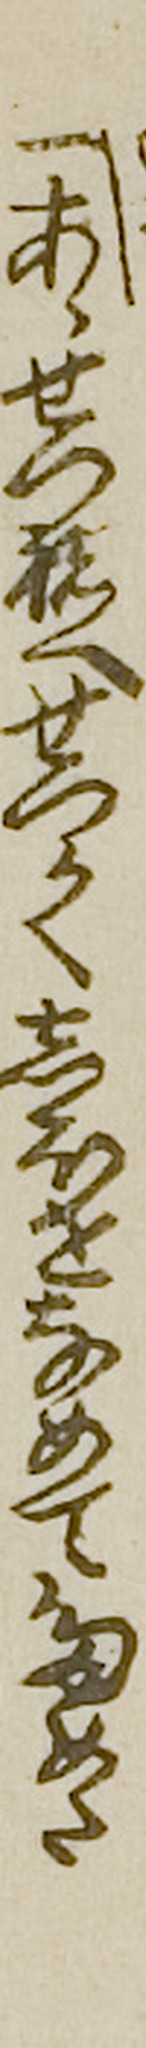〽あゝせつねへせつかくしほをなめてためた
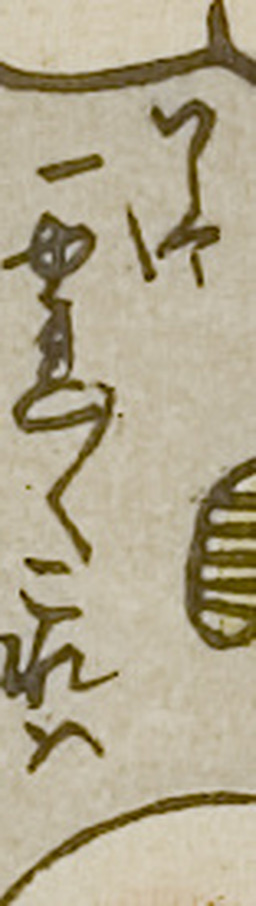〽やれ〳〵これは
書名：[鯰に金銀を吐かされる持丸]
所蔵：東京大学総合図書館 General Library in the University of Tokyo, JAPAN
